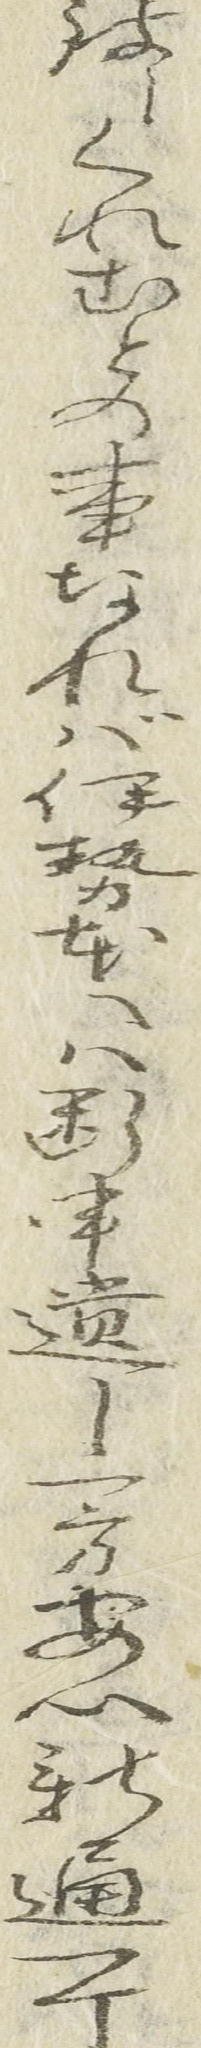致しくれむとの事なれば伊勢本へは断申遺し一方安心新通一丁
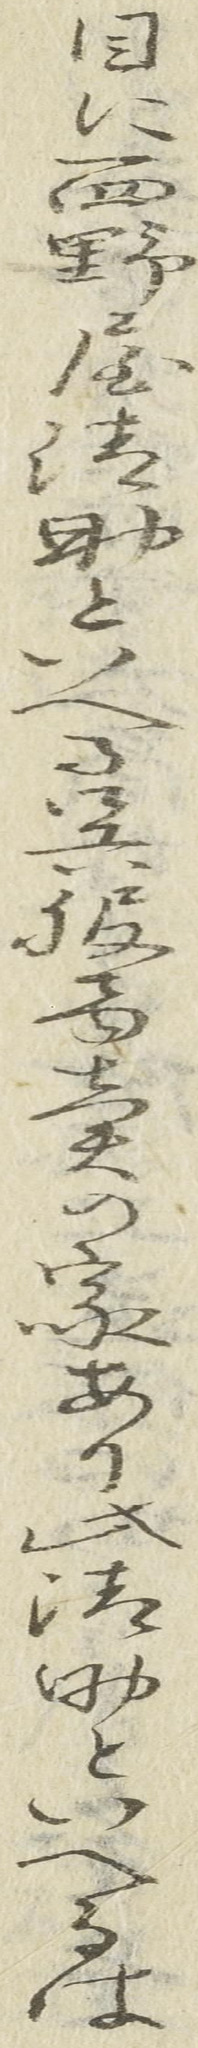目に西野屋清助といへる呉服商売の家あり此清助といへるは
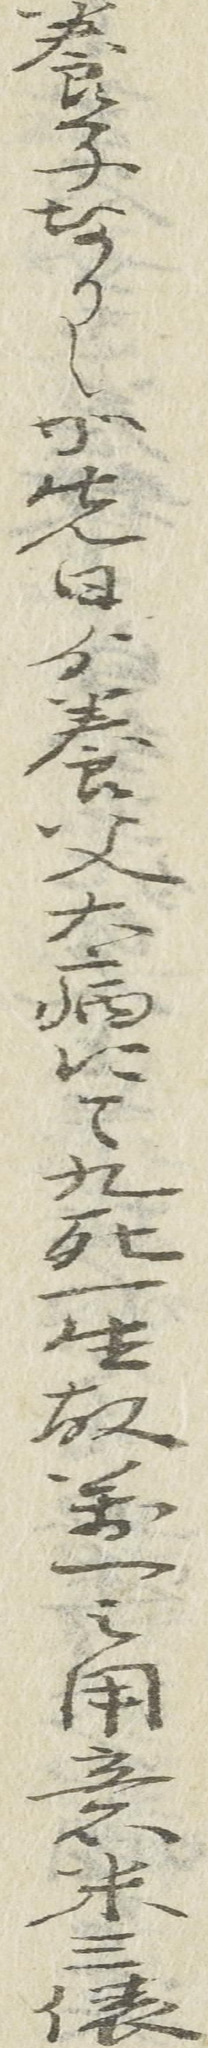養子なりしが先日ゟ養父大病にて九死一生故万一の用意米三俵
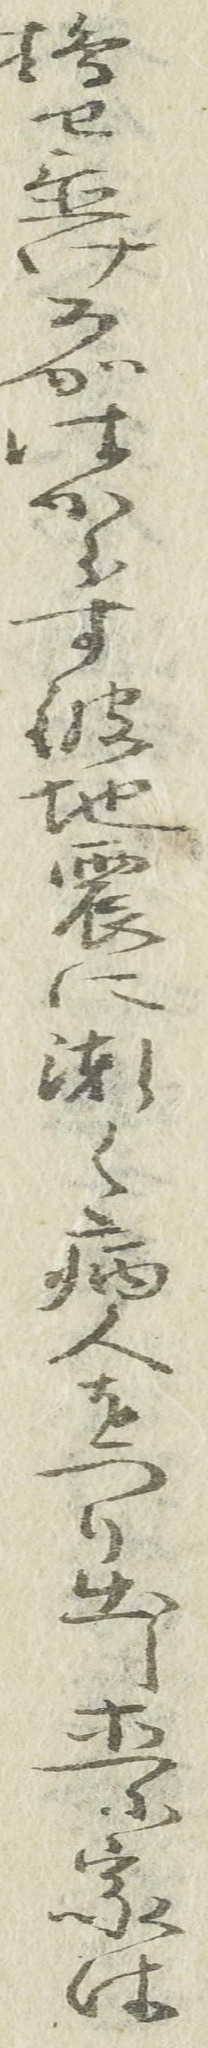搗せ置けるがはからす彼地震に漸く病人をつり出し直に家は
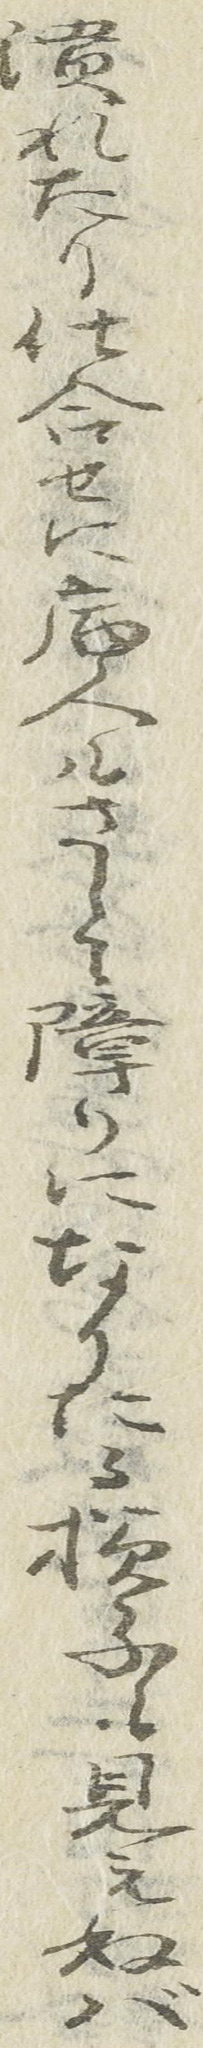潰れたり仕合せに病人もさして障りになりたる様子も見えねば
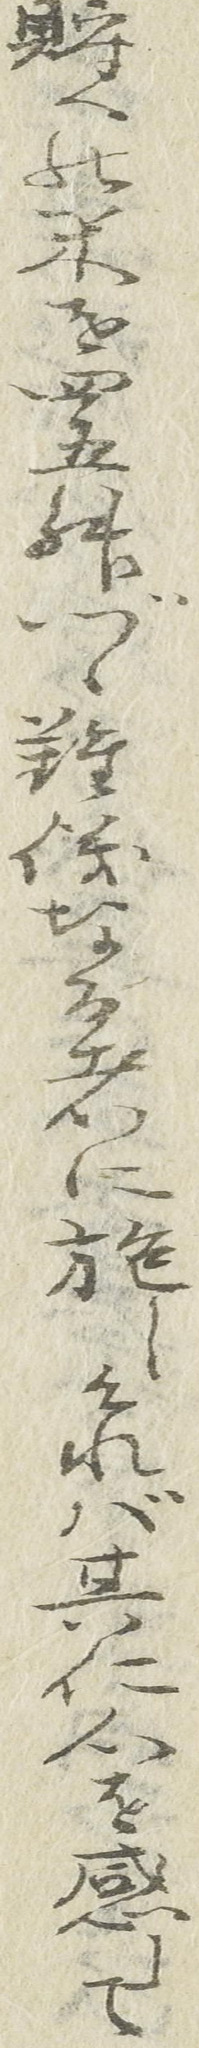貯への米を四五升づゝ難儀なる者に施しければ其仁心を感して
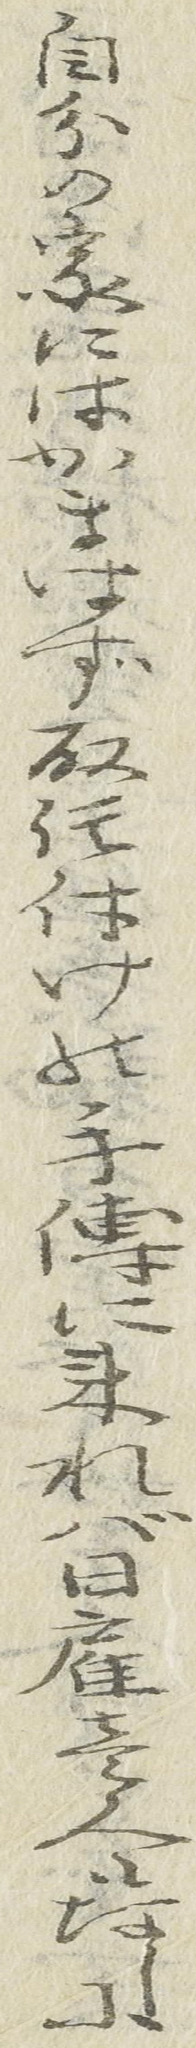自分の家にはかまはず取片付けの手傳に来れば日雇壱人もなしに
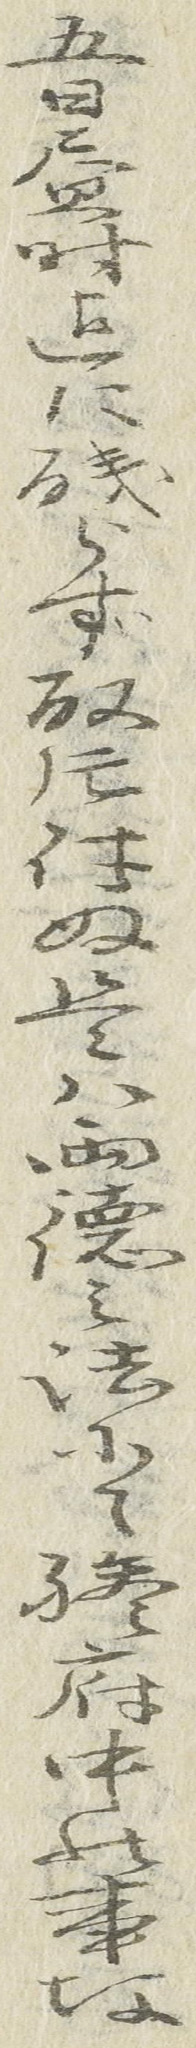五日昼時迄に残らず取片付ぬ是は両徳之法にて驂府中の事な
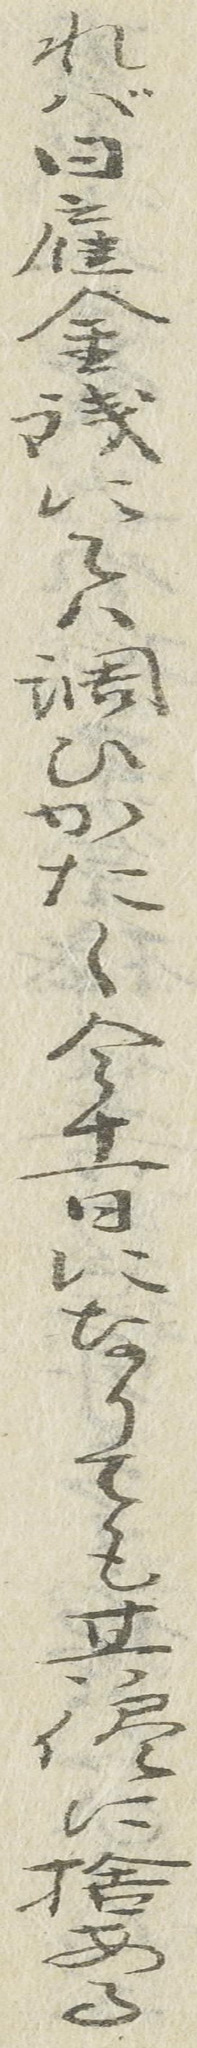れば日雇金銭にては調ひかたく今十一日になりても其儘に捨ある
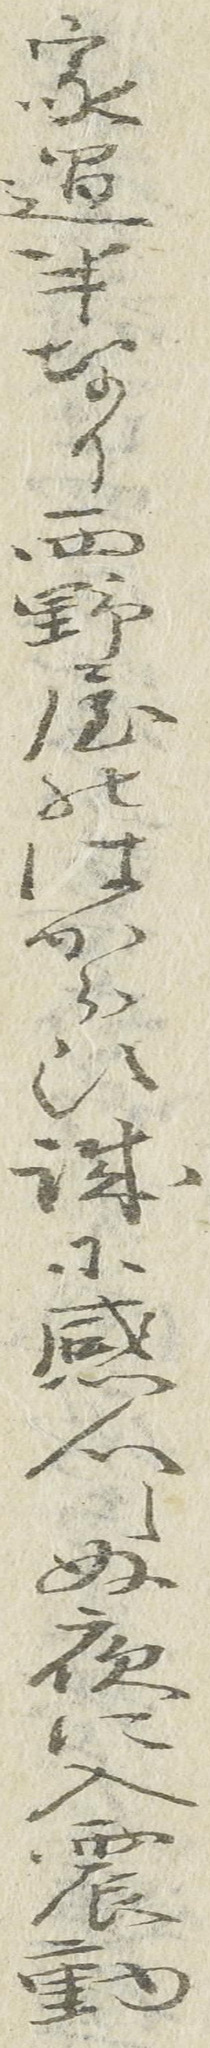家過半なり西野屋のはからひ誠に感心しぬ夜に入震動
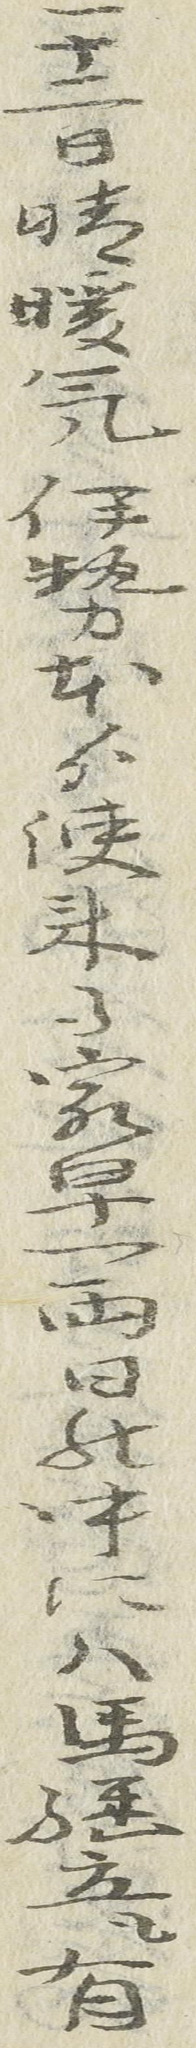一十二日晴暖気伊勢本ゟ使来る最早一両日の中には馬継立も有
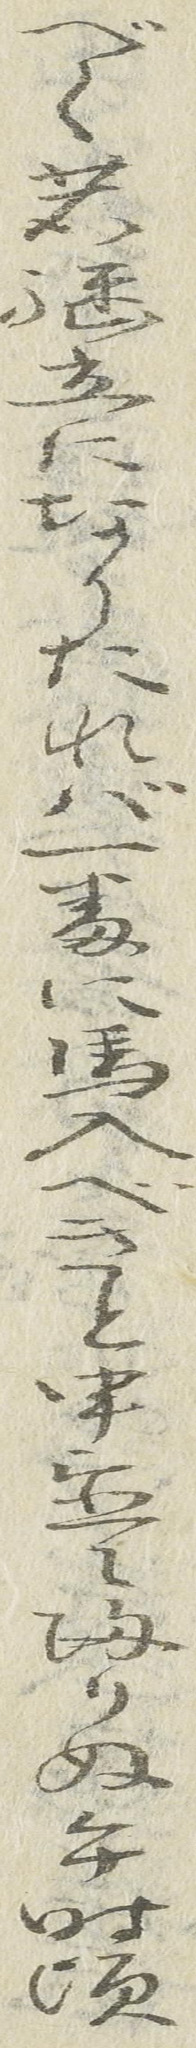べし若継立になりたれば一番に馬入べきを申置て帰りぬ午時頃
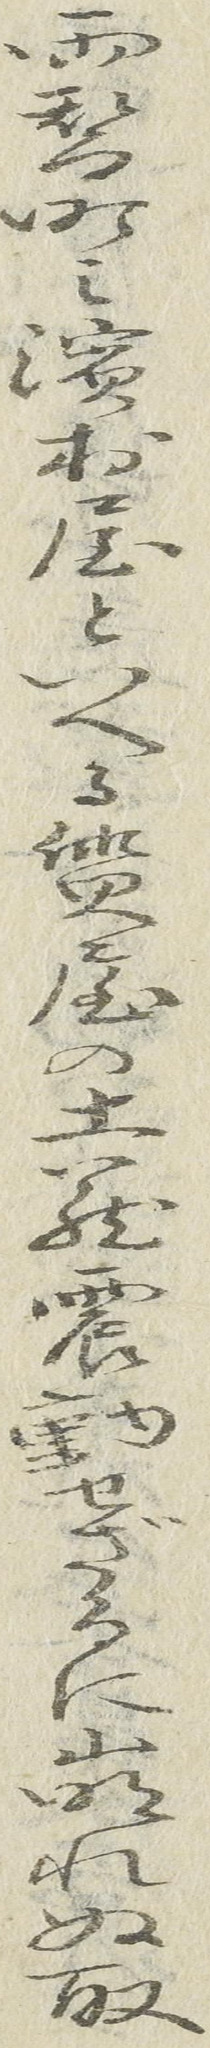両替町の濱村屋といへる質屋の土蔵震動せざるに崩れぬ取

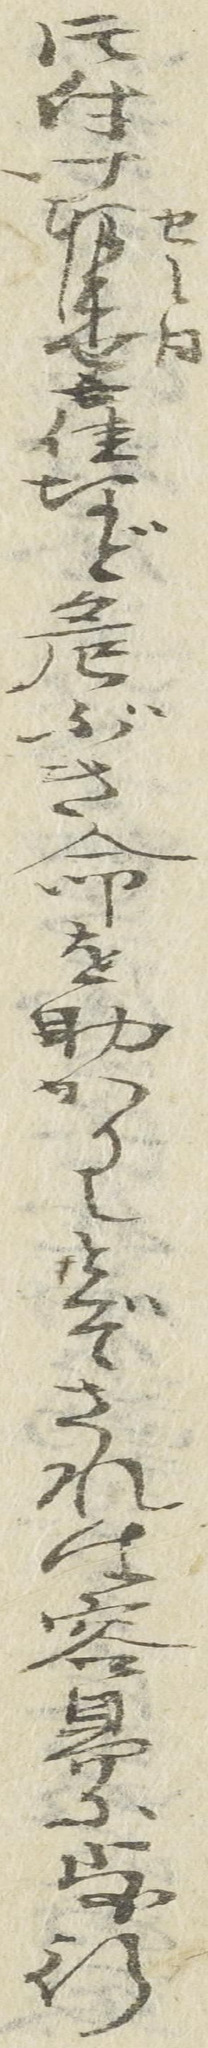片付けせし日雇など危ぶき命を助かりしとぞされは容易に歩行
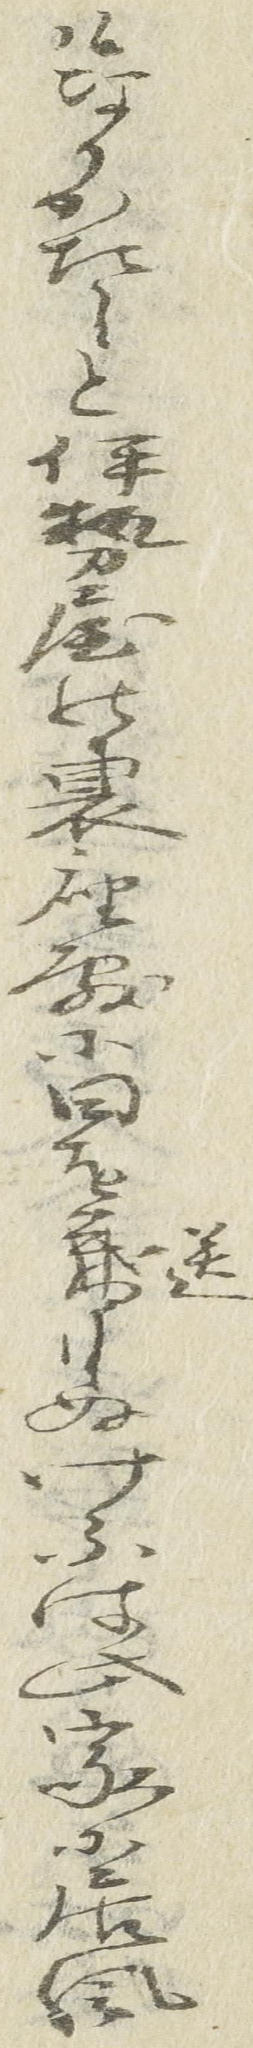もなりかたしと伊勢屋の裏座敷に日を送りぬけふは此家に居風
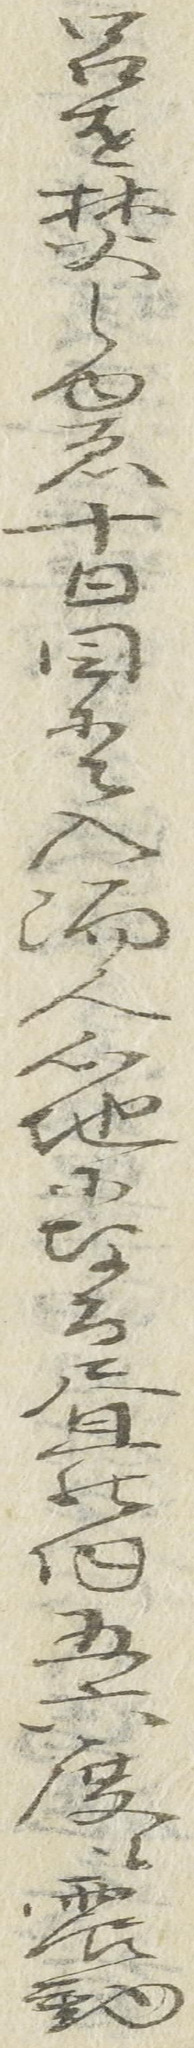呂を焚しゆゑ十日目にて入湯人心地になる昼の内五六度も震動
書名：地震前兆集　全
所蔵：東京大学地震研究所図書室 Earthquake Research Institute Library, The University of Tokyo, JAPAN
